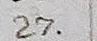27.
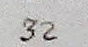32
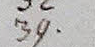39.
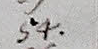54.
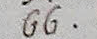66
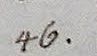46.
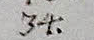34.
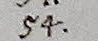54.
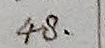48.
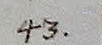43.
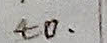40.
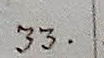33.
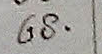68.
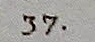37.
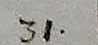31.
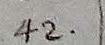42.
